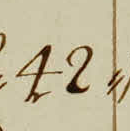42
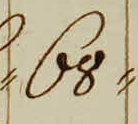68
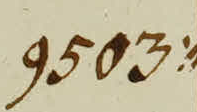9503
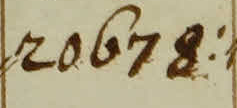20678
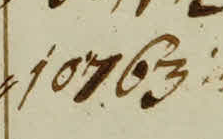10763
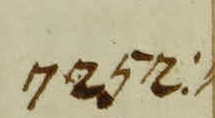7252.
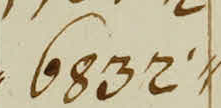6832
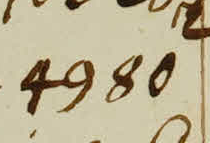4980
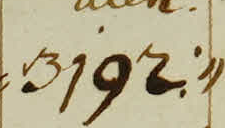3192.
